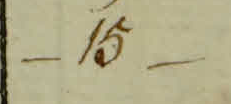- 15 -
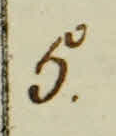5.
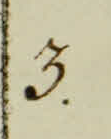3.
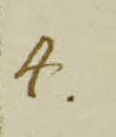4.
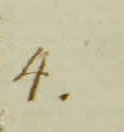4.
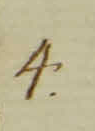4.
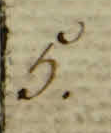5.
